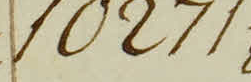10271
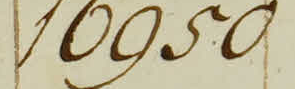16950
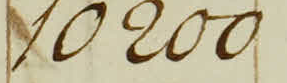10200
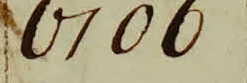6106
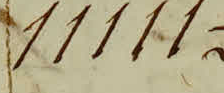1111
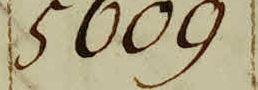1509
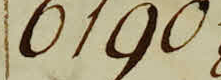6190
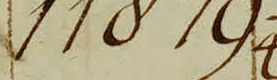11879
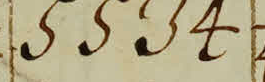5534
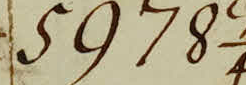5978
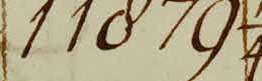11879
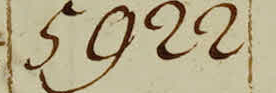5922
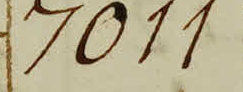7011
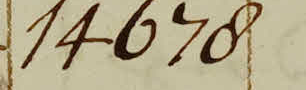14678
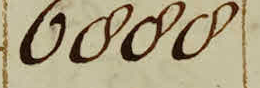6888
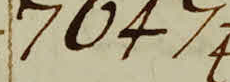7647
